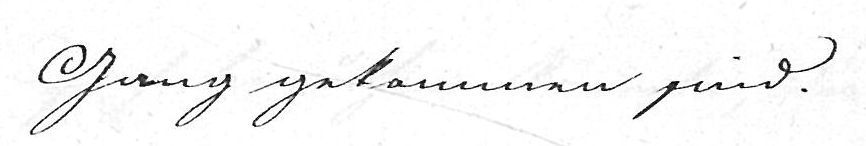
Gang gekommen sind.
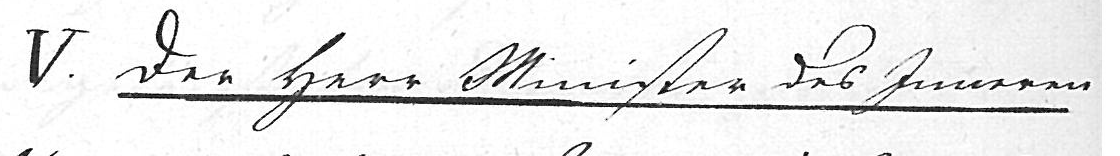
V. Der Herr Minister des Inneren
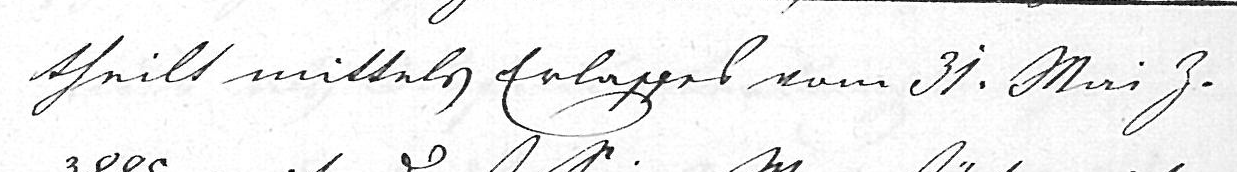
theilt mittels Erlasses vom 31. Mai Z.
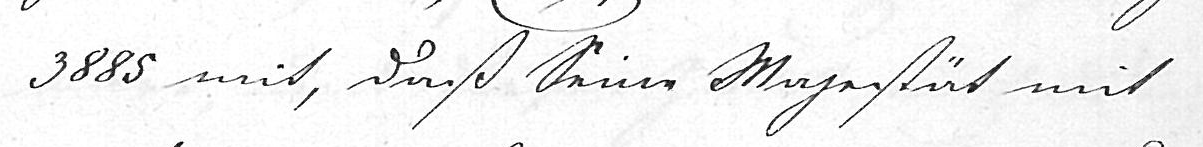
3885 mit, daß Seine Majestät mit
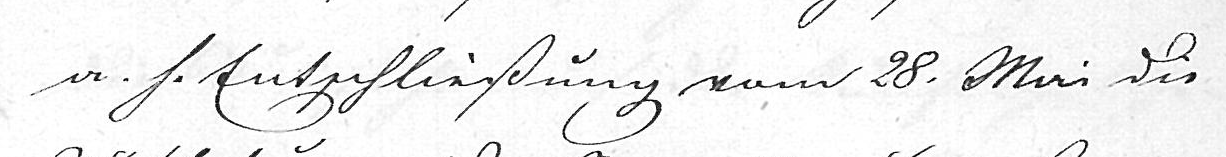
a.h. Entschließung vom 28. Mai die
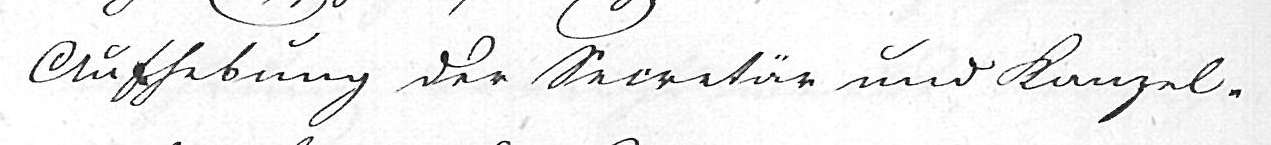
Aufhebung der Secretär und Kanzel-
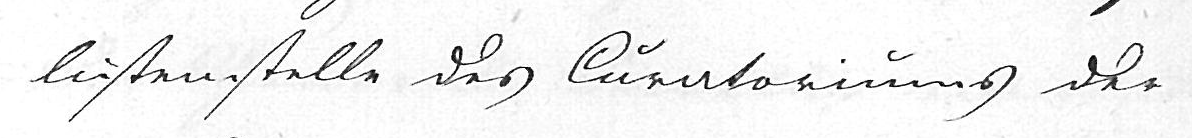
listenstelle des Curatoriums der
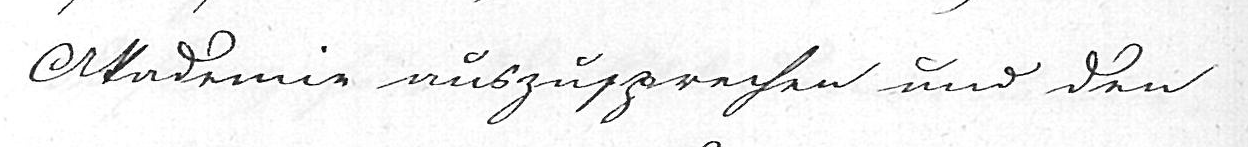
Akademie auszusprechen und den
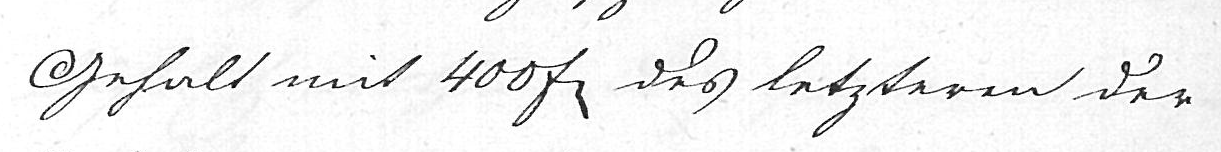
Gehalt mit 400 fl des letzteren der
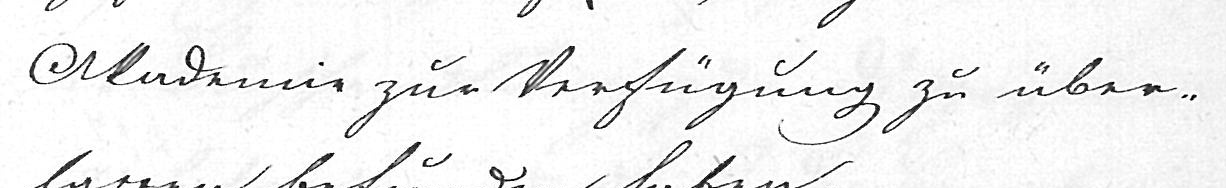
Akademie zur Verfügung zu über-
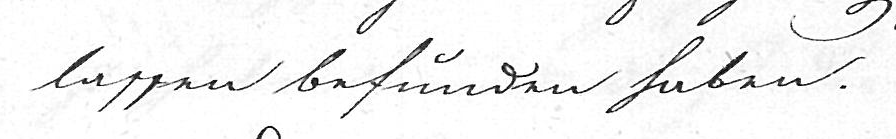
lassen befunden haben.
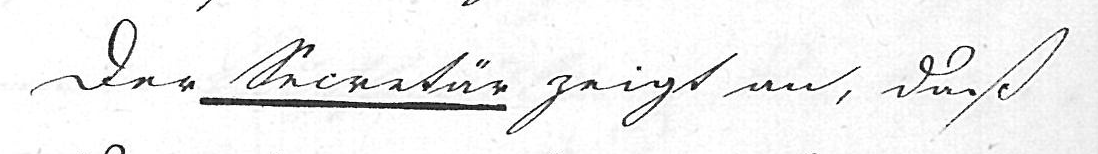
Der Secretär zeigt an, daß
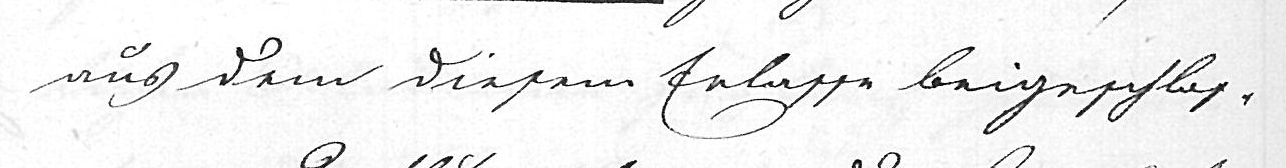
aus dem diesem Erlasse beigeschlos-
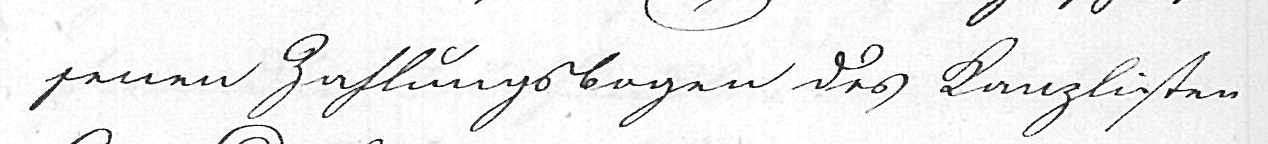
senen Zahlungsbogen des Kanzlisten
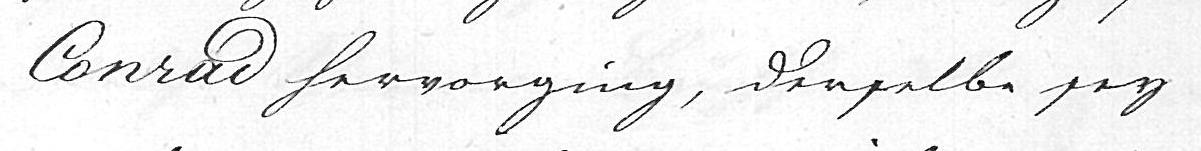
Conrad hervorging, derselbe sey
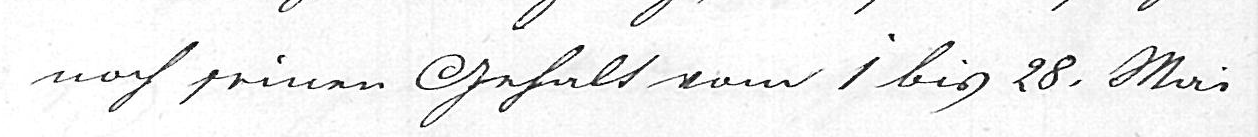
noch seinen Gehalt vom 1 bis 28. Mai
